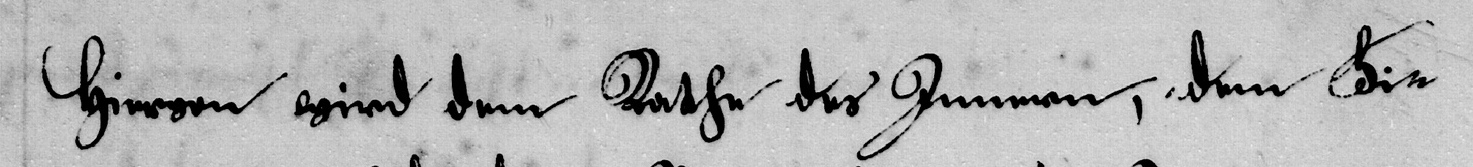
Hievon wird dem Rathe des Innern, dem Fi¬
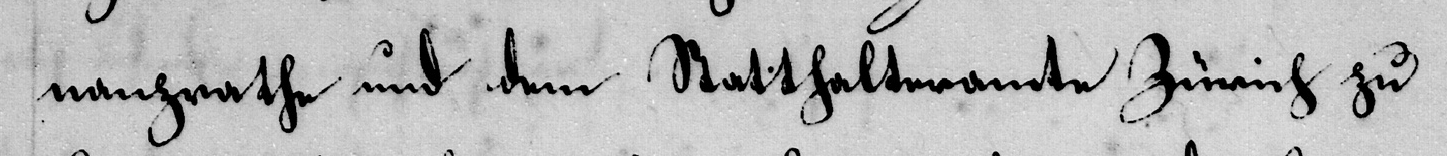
nanzrathe und dem Statthalteramte Zürich zu
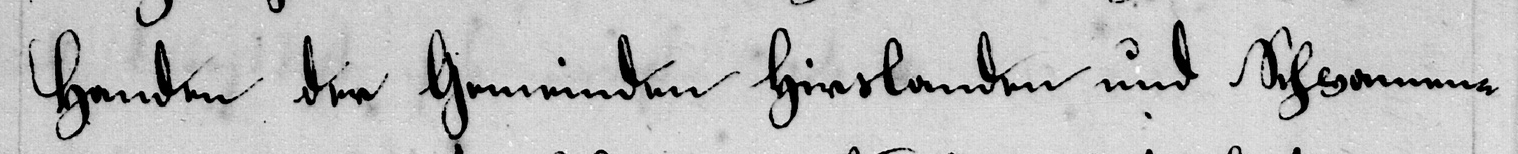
Handen der Gemeinden Hirslanden und Schwamen¬
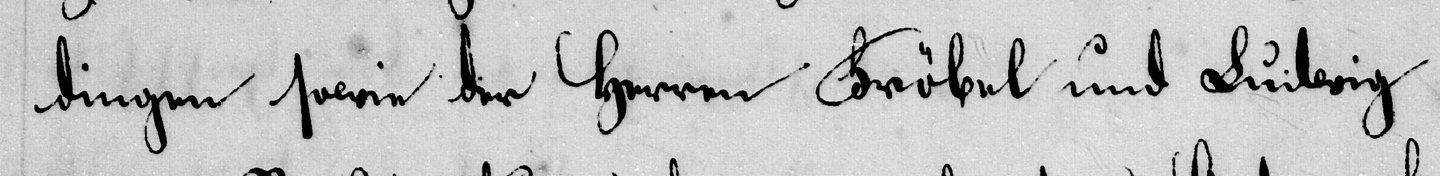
dingen sowie der Herren Fröbel und Ludwig
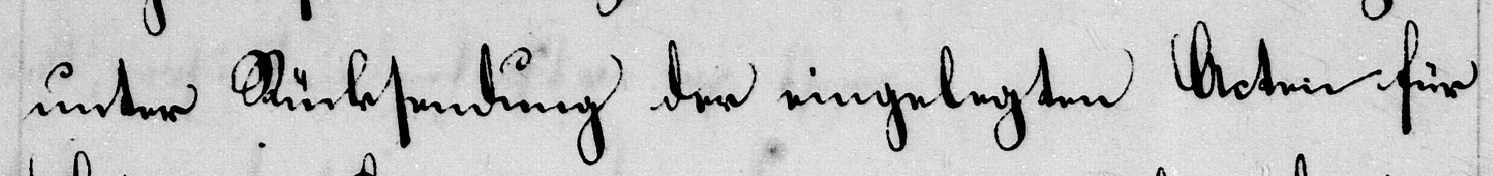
unter Rücksendung der eingelegten Acten für
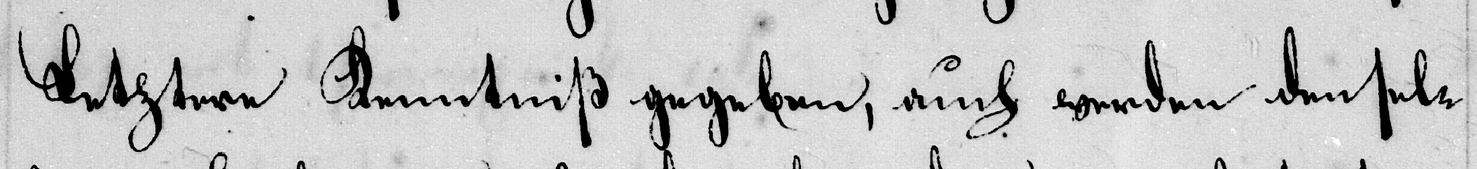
Letztere Kenntniß gegeben, auch werden densel¬
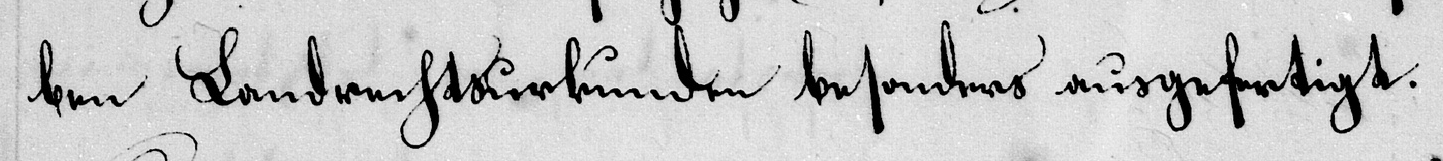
ben Landrechtsurkunden besonders ausgefertigt.
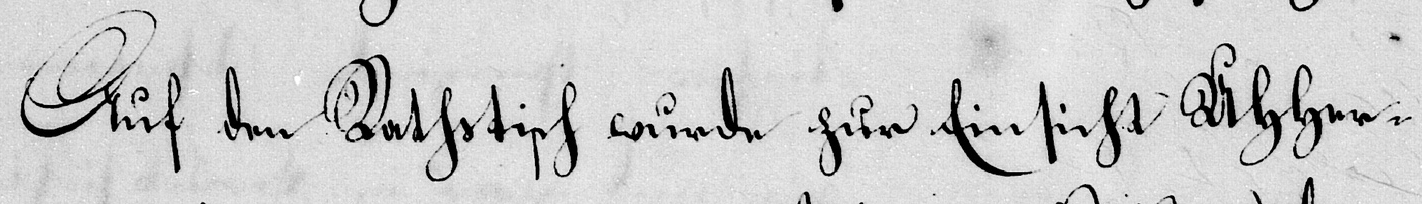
Auf den Rathstisch wurde zur Einsicht UHHer¬
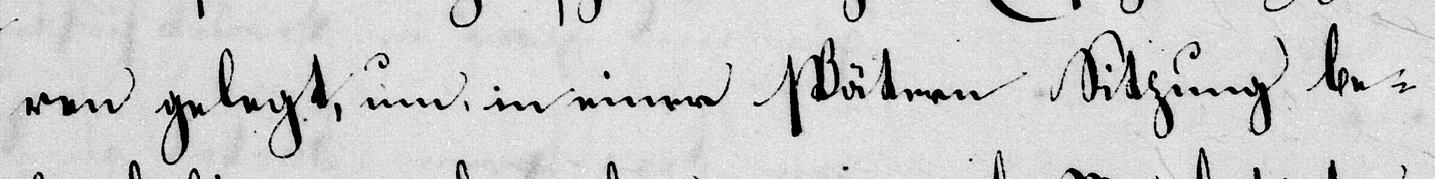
ren gelegt, um in einer spätern Sitzung be¬
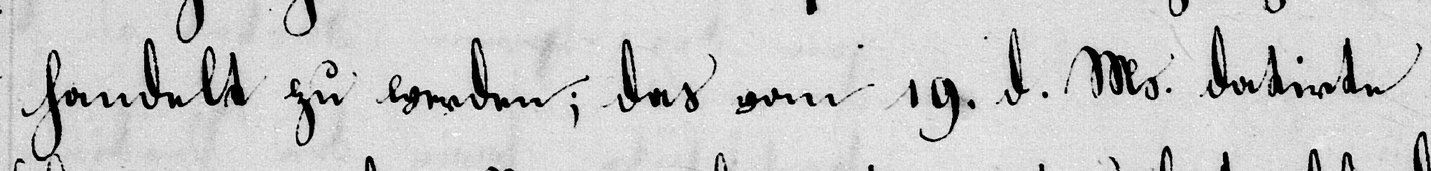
handelt zu werden; das vom 19. d. Ms. datirte
